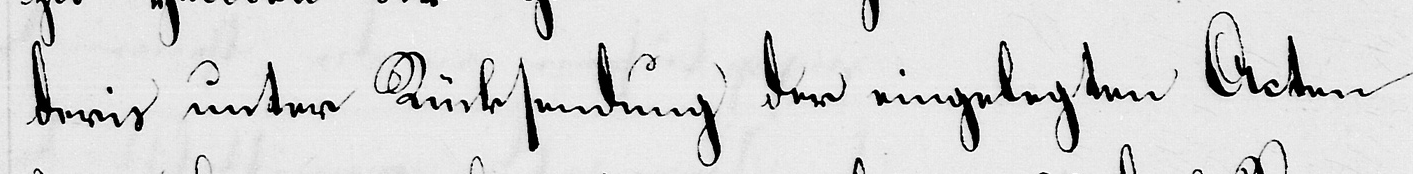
deris unter Rücksendung der eingelegten Acten
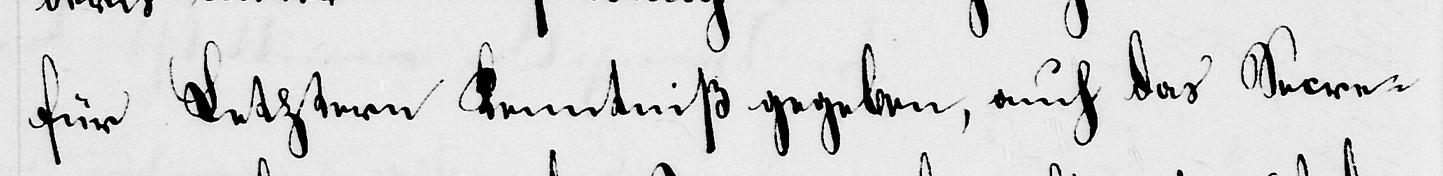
für Letztern Kenntniß gegeben, auch das Secre¬
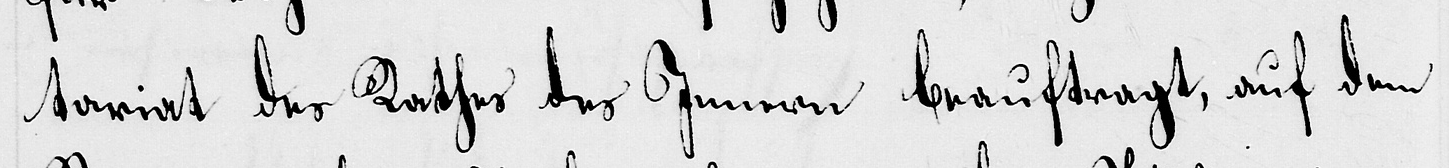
tariat des Rathes des Innern beauftragt, auf dem
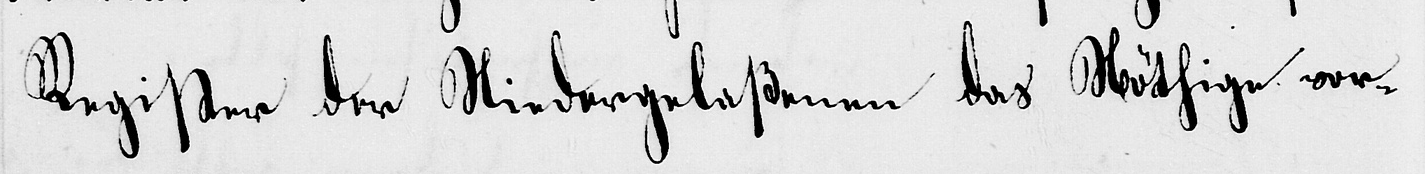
Register der Niedergelaßenen das Nöthige vor¬
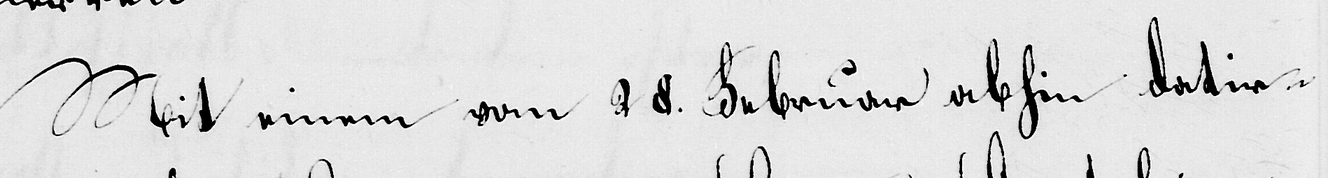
Mit einem vom 28. Februar abhin datir¬
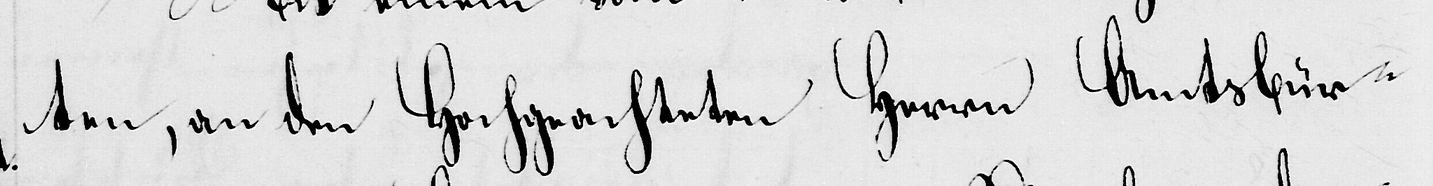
ten, an den Hochgeachteten Herrn Amtsbür¬
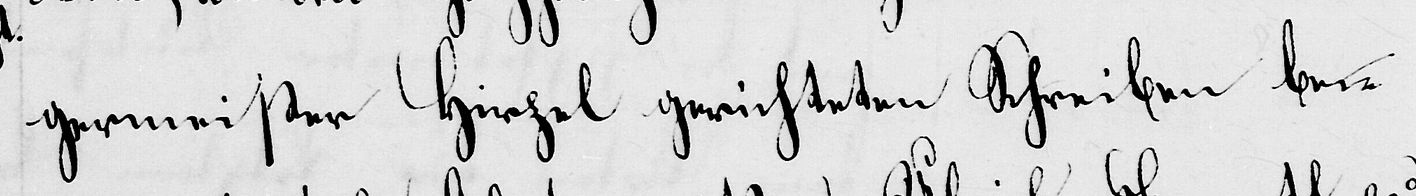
germeister Hirzel gerichteten Schreiben be¬
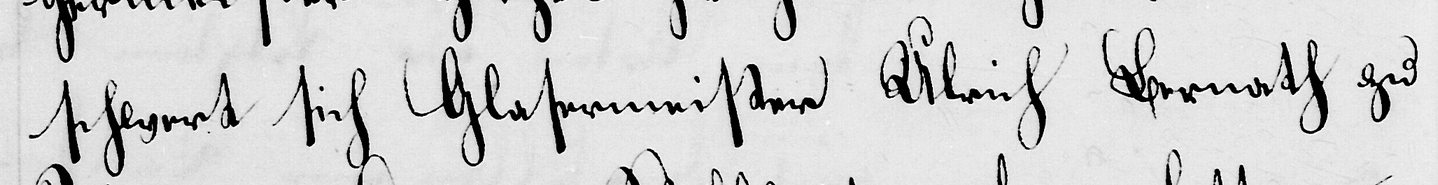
schwert sich Glasermeister Ulrich Bernath zu
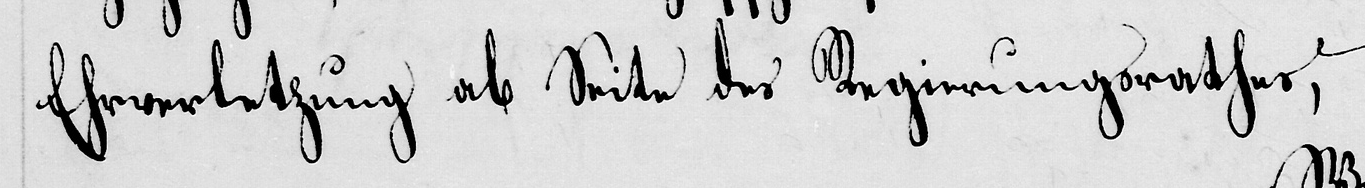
Ehrverletzung ab Seite des Regierungsrathes,
